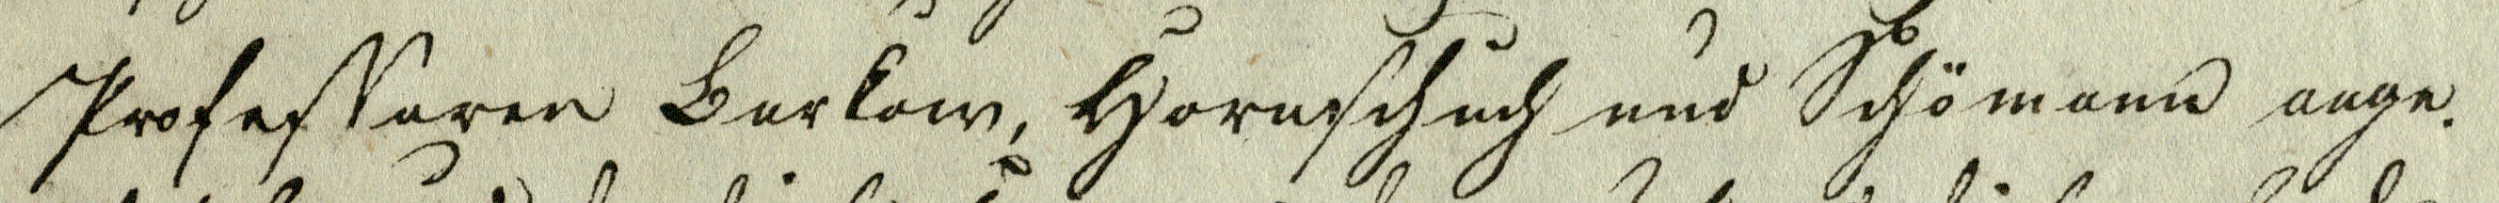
Professoren Barkow, Hornschuch und Schömann ange¬
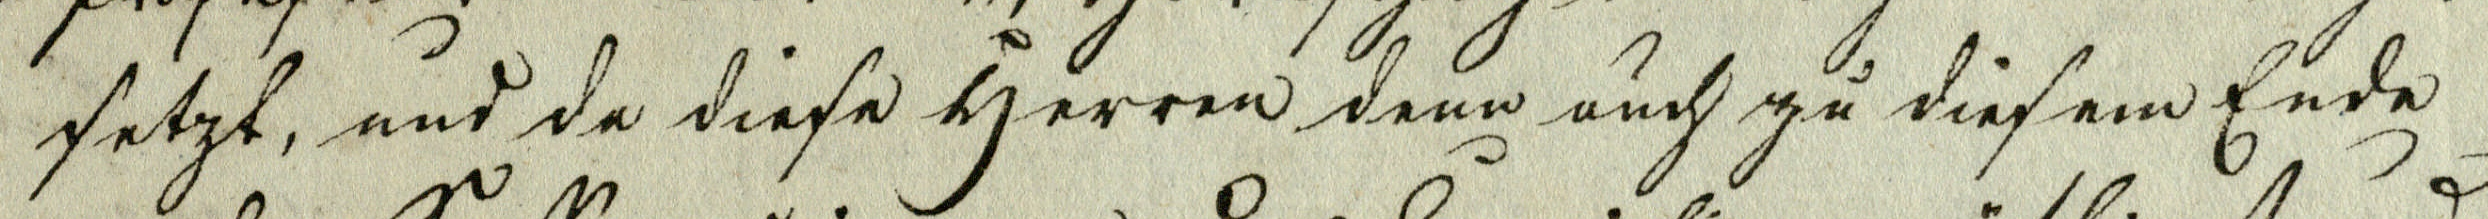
setzt, und da diese Herren denn auch zu diesem Ende
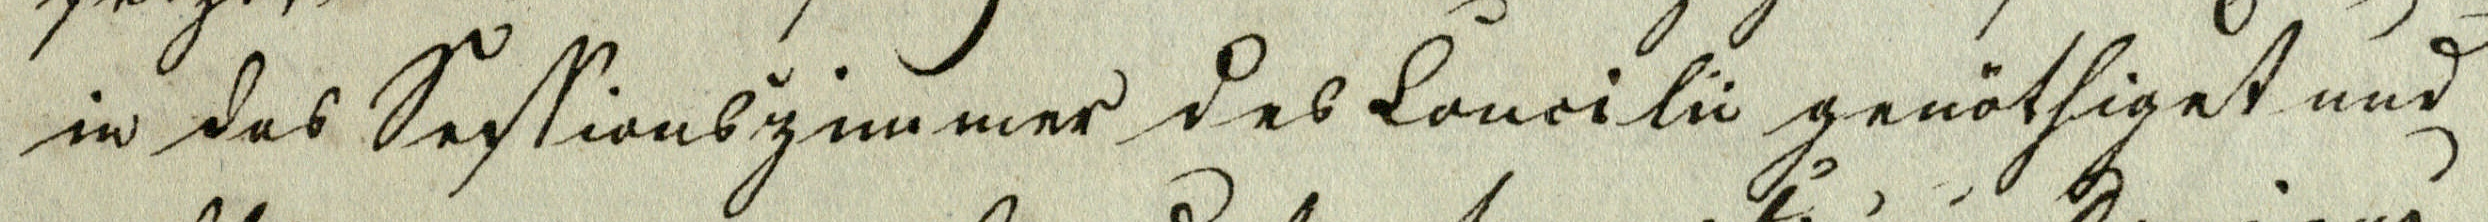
in das Sessionszimmer des Concilii genöthiget und
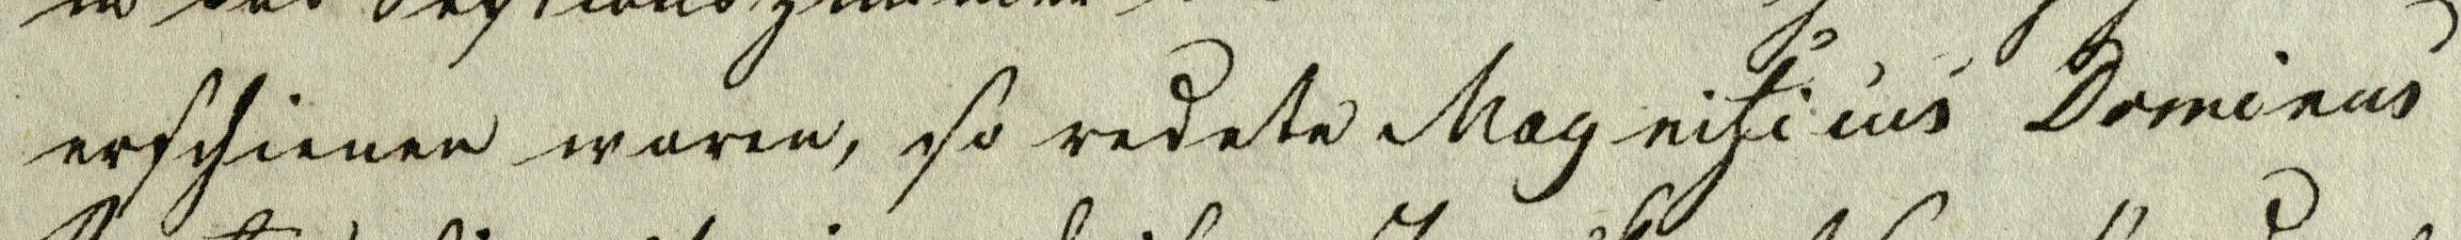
erschienen waren, so redete Magnificus Dominus
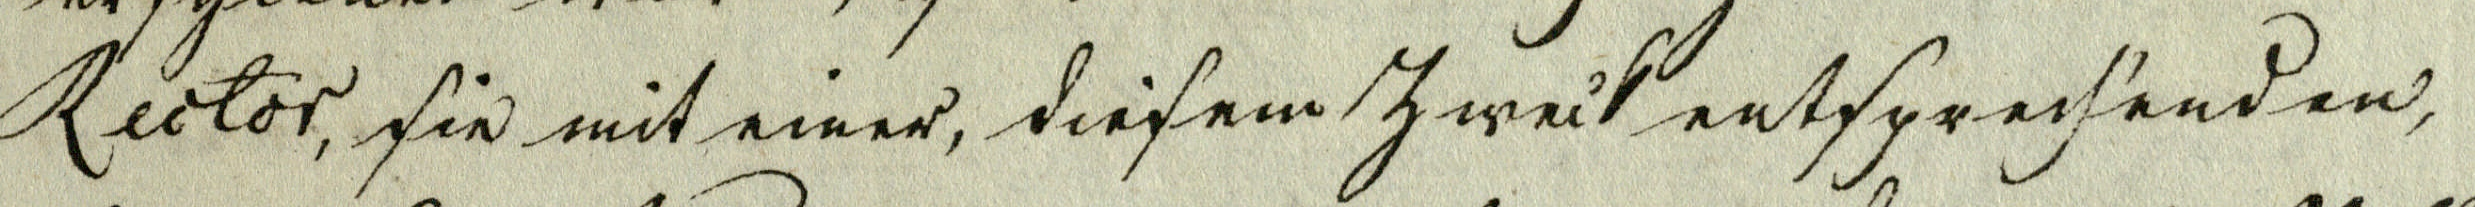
Rector, sie mit einer, diesem Zweck entsprechenden,
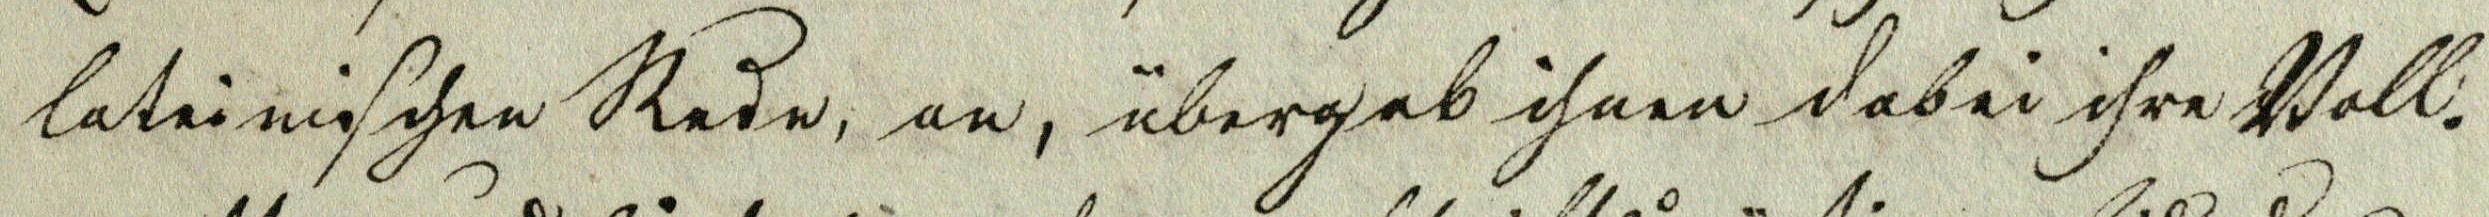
lateinischen Rede, an, übergab ihnen dabei ihre Voll¬
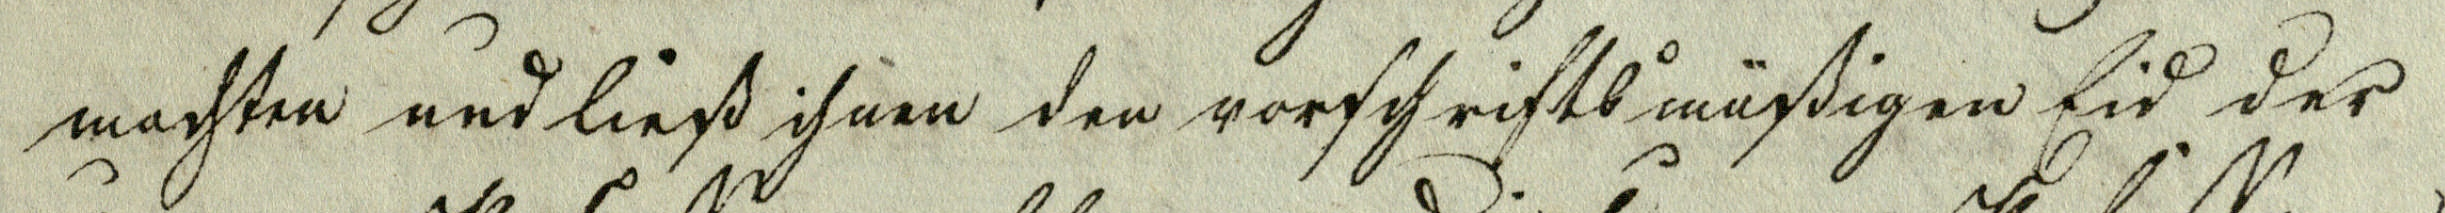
machten und ließ ihnen den vorschriftsmäßigen Eid der
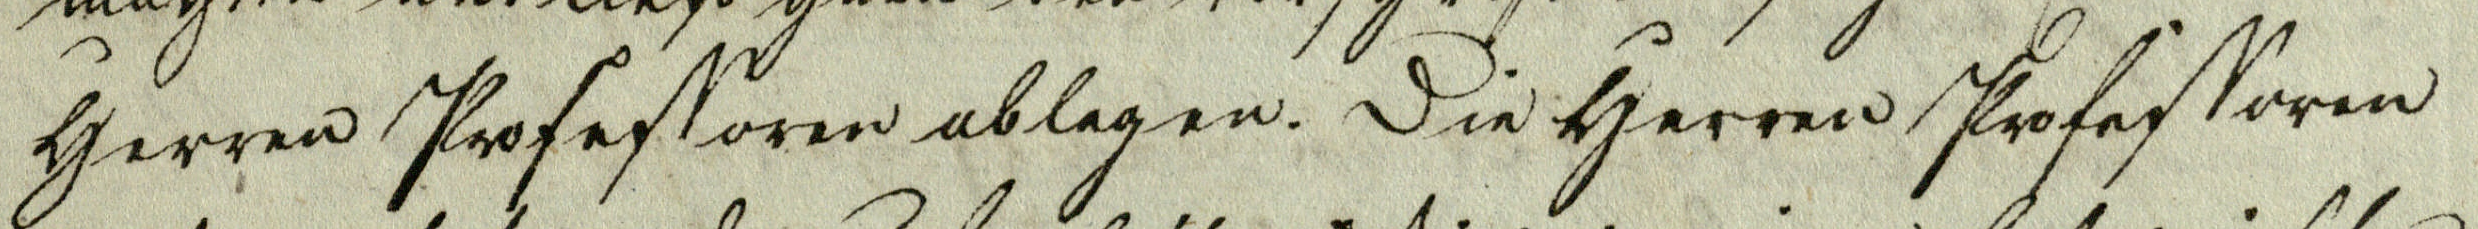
Herren Professoren ablegen. Die Herren Professoren
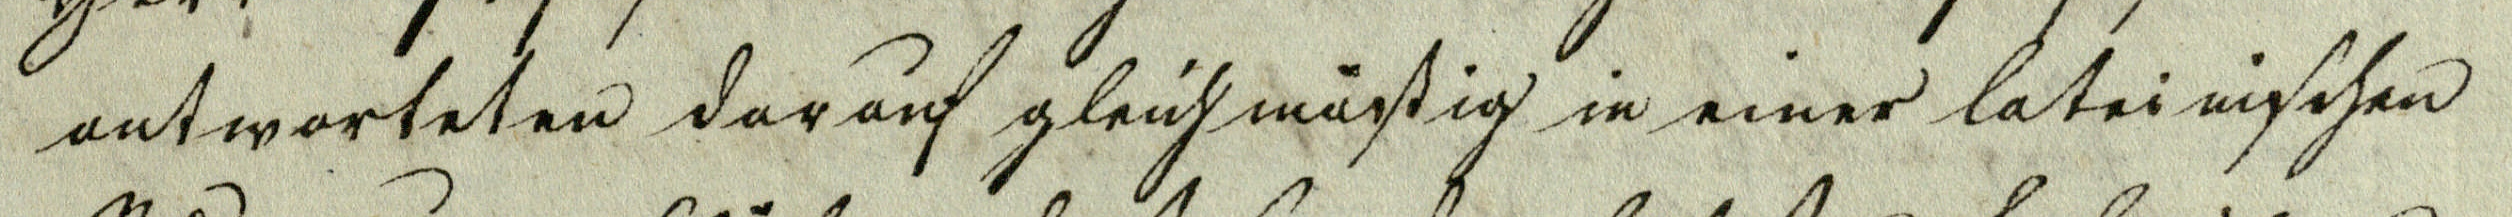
antworteten darauf gleichmäßig in einer lateinischen
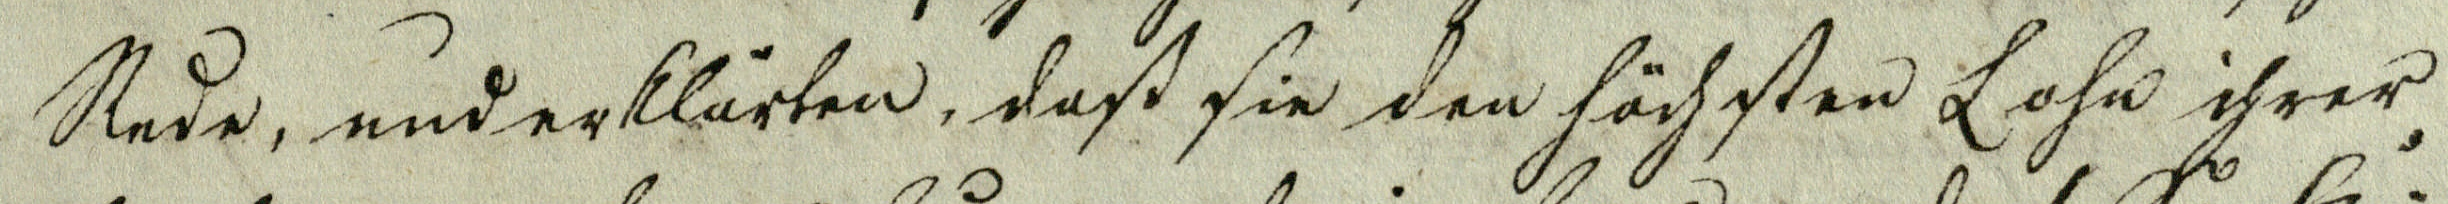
Rede, und erklärten, daß sie den höchsten Lohn ihrer
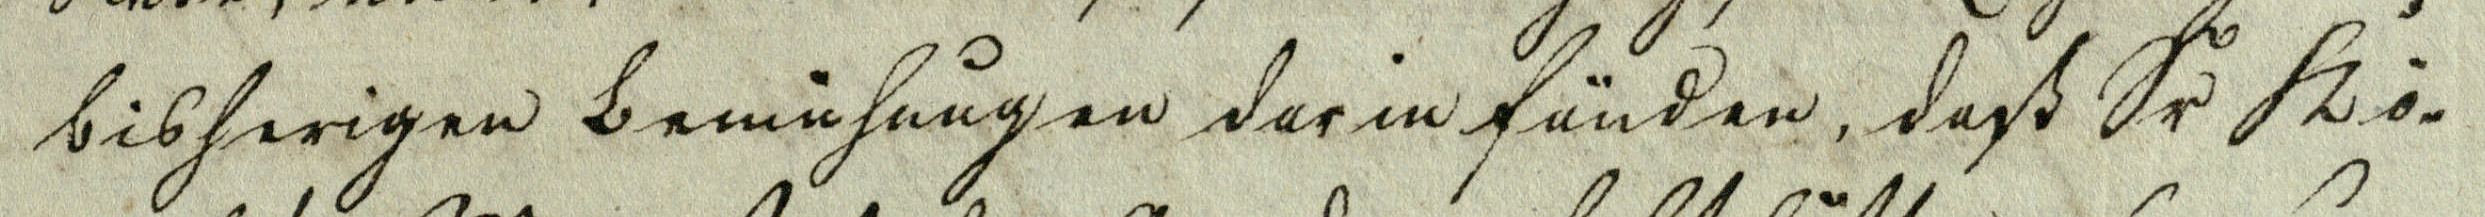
bisherigen Bemühungen darin fänden, daß Sr Kö¬
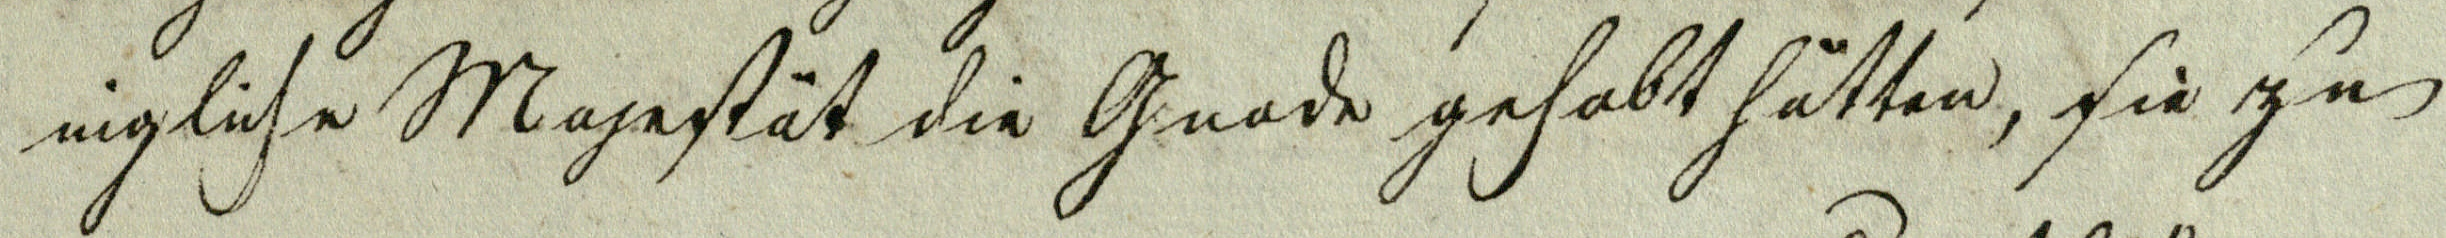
nigliche Majestät die Gnade gehabt hätten, sie zu
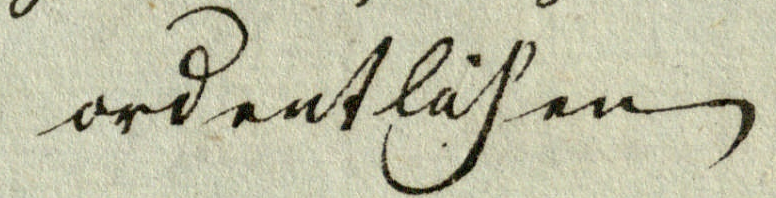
ordentlichen
